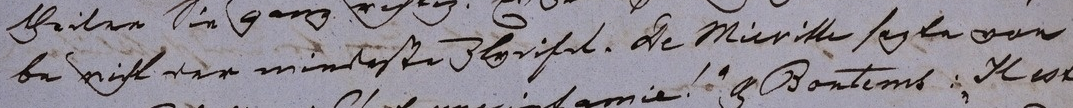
be nicht der mindeste Zweifel. De Mieville sagte von
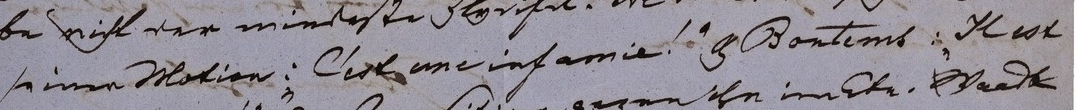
seiner Motion: «C'est une infamie!» & Bontems: «Il est
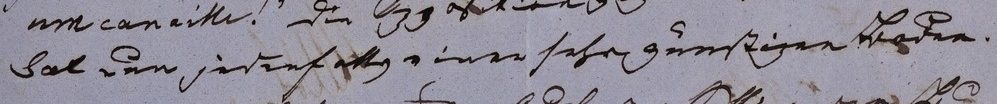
hat nun jedenfalls einen sehr günstigen Boden.
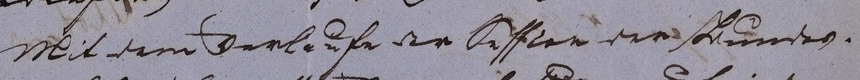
Mit dem Verlaufe der Session der Bundes-
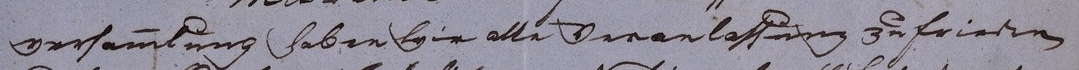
versammlung haben wir alle Veranlassung zufrieden
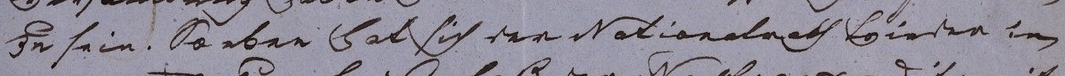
zu sein. So eben hat sich der Nationalrath wieder in
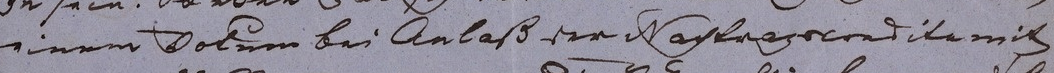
einem Votum bei Anlaß der Nachtragscredite mit
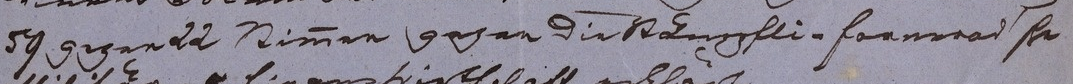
59 gegen 22 Stimmen gegen die Stämpfli-Fornerod'sche
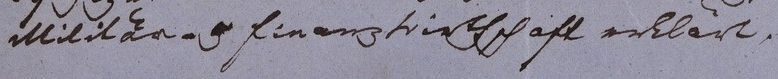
Militär- & Finanzwirthschaft erklärt.
